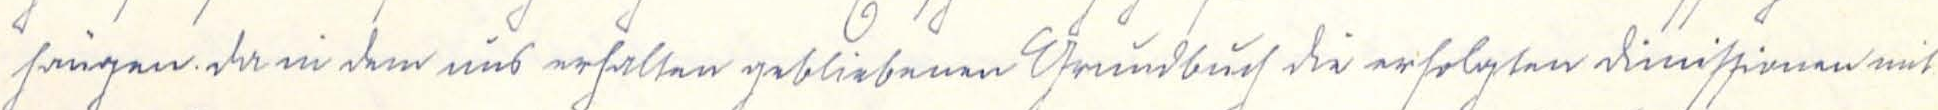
hängen da in dem uns erhalten gebliebenen Grundbuch die erfolgten Dimissionen mit
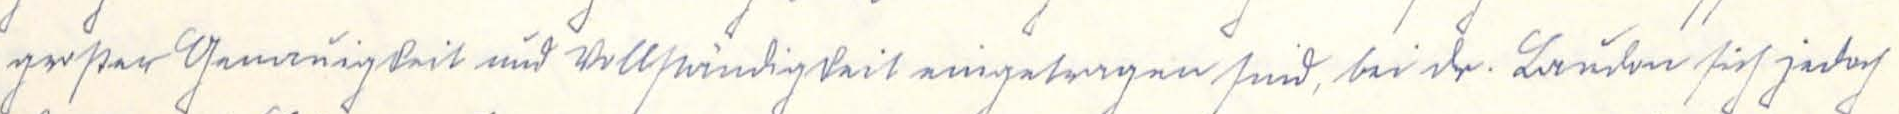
ganzer Gründlichkeit und Vollständigkeit eingetragen sind, bei Dr. Laudon sich jedoch
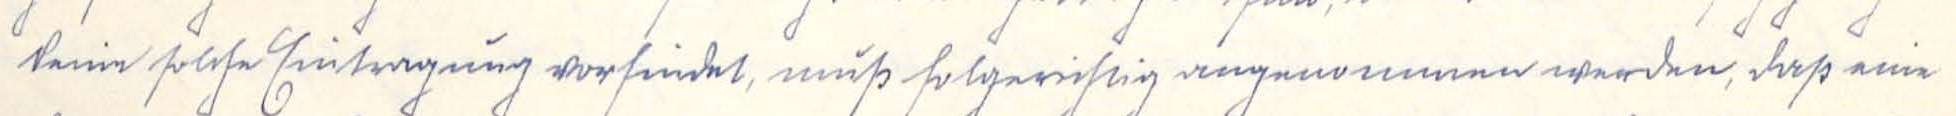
keine solche Eintragung vorfindet, muß folgerichtig angenommen werden, daß eine
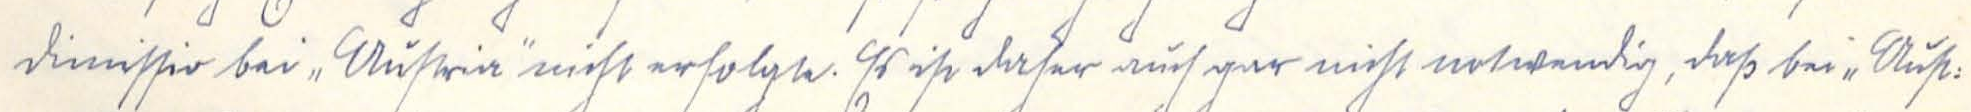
Dimissio bei "Austria" nicht erfolgte. Es ist daher auch gar nicht notwendig, daß bei "Aust-
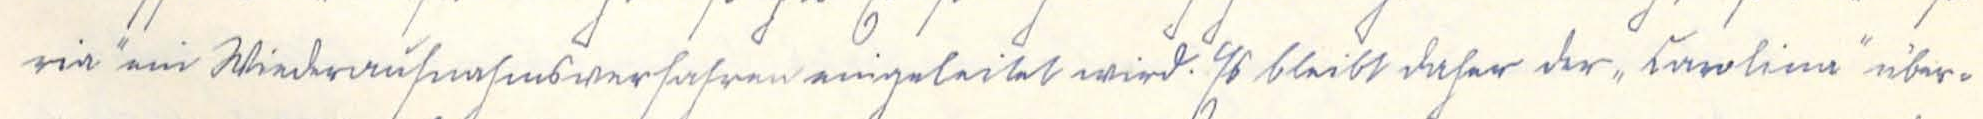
ria" ein Wiederaufnahmsverfahren eingeleitet wird. Es bleibt daher der "Carolina" über-
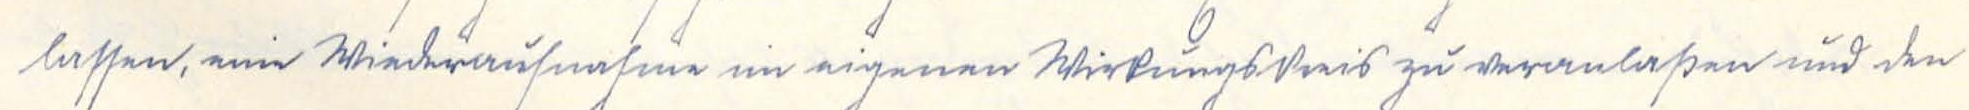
lassen, eine Wiederaufnahme im eigenen Wirkungskreis zu veranlaßen und den
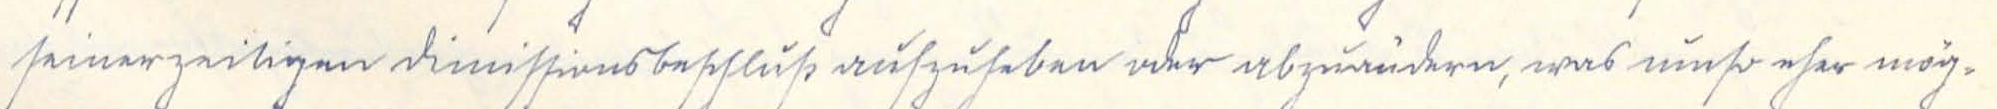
seinerzeitigen Dimissionsbeschluß aufzuheben oder abzuändern, was umso eher mög-
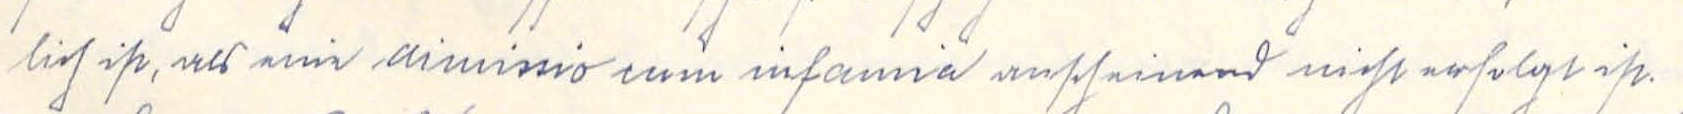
lich ist, als eine Dimissio cum infamia anscheinend nicht erfolgt ist.
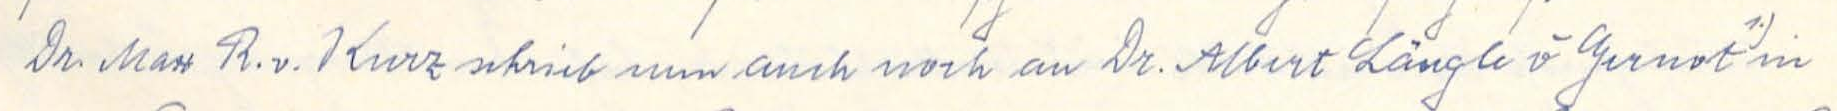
Dr. Max R. von Kurz schrieb nun auch noch an Dr. Albert Längle v/o Gernot 1.) in
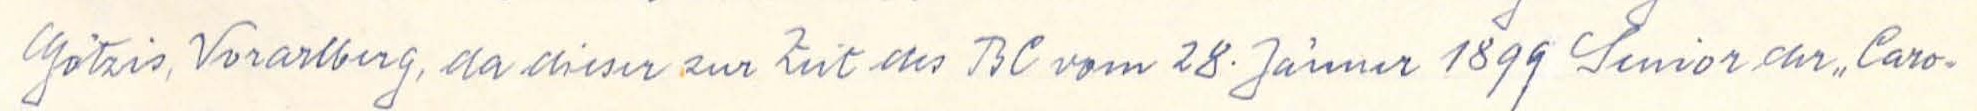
Götzis, Vorarlberg, da dieser zur Zeit des BC vom 28. Jänner 1899 Senior der "Caro-
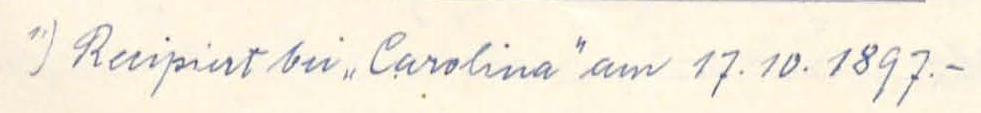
1.) Recipiert bei "Carolina" am 17. 10. 1897
